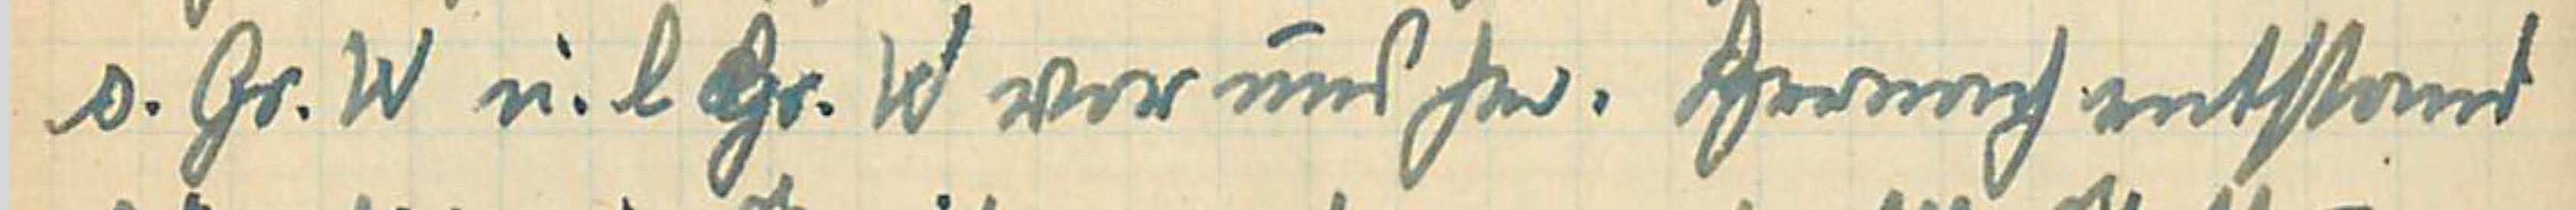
s. Gr. W. u. l. Gr. W. vor uns her. Hernach entstand
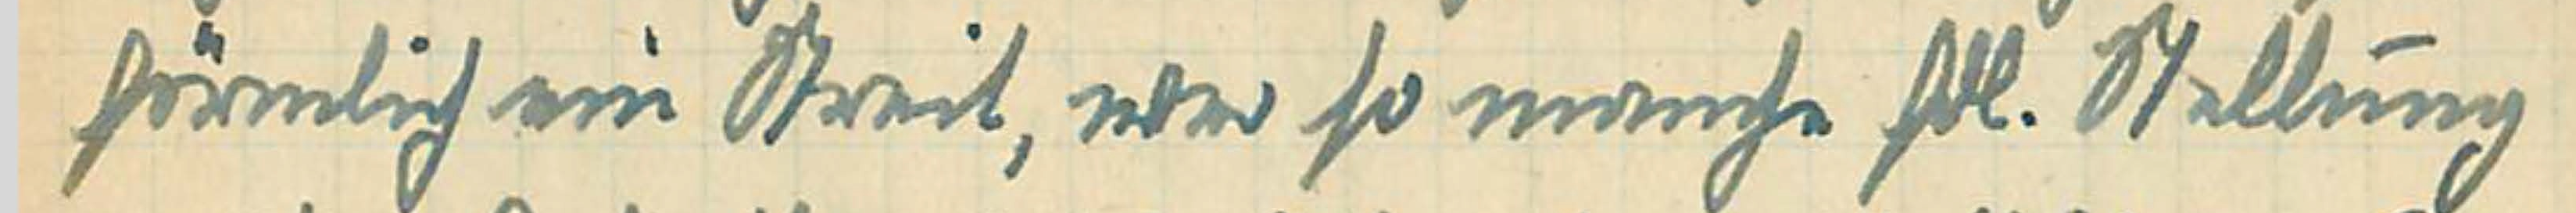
förmlich ein Streit, wer so manche fdl. Stellung
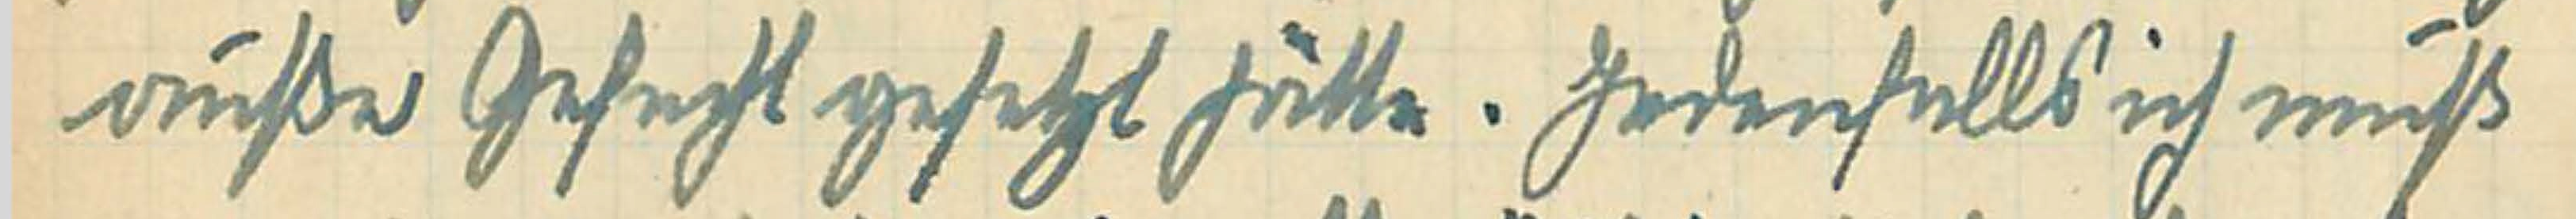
außer Gefecht gesetzt hätte. Jedenfalls ich muß
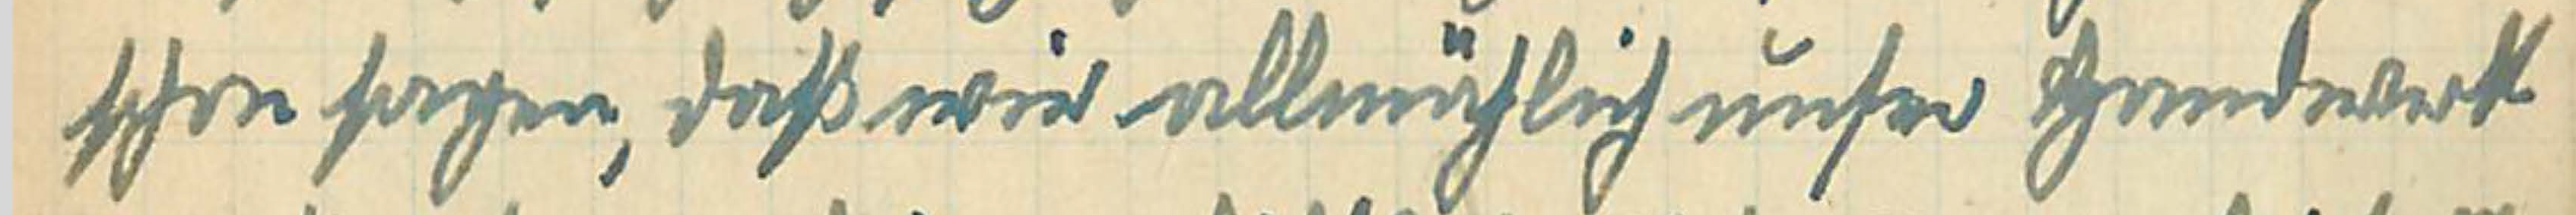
schon sagen, daß wir allmählich unser Handwerk
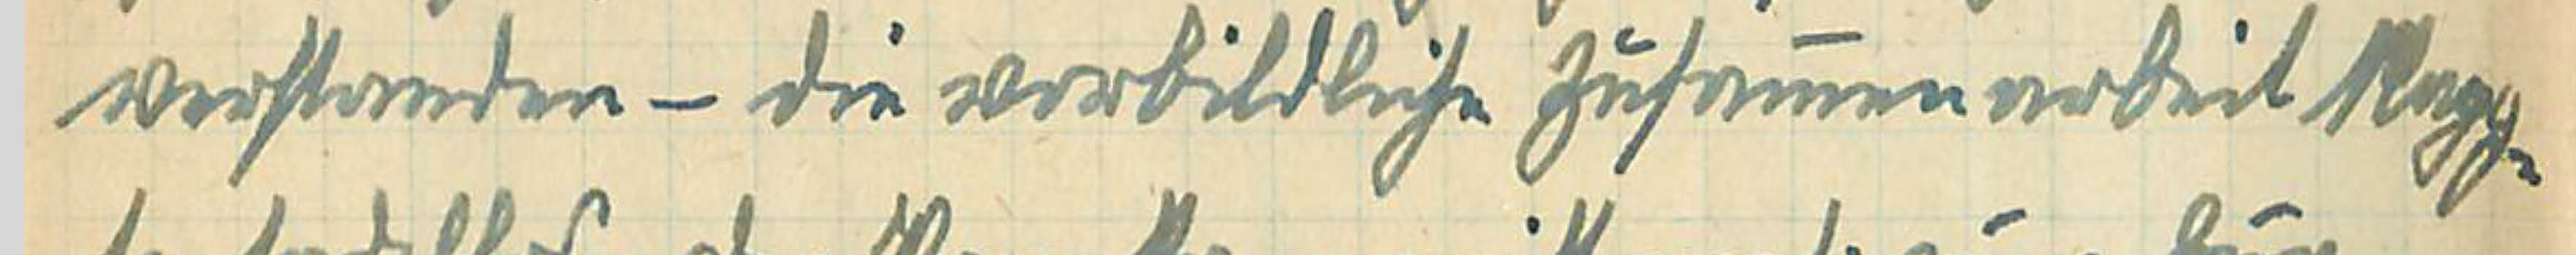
verstanden – die vorbildliche Zusammenarbeit klapp-
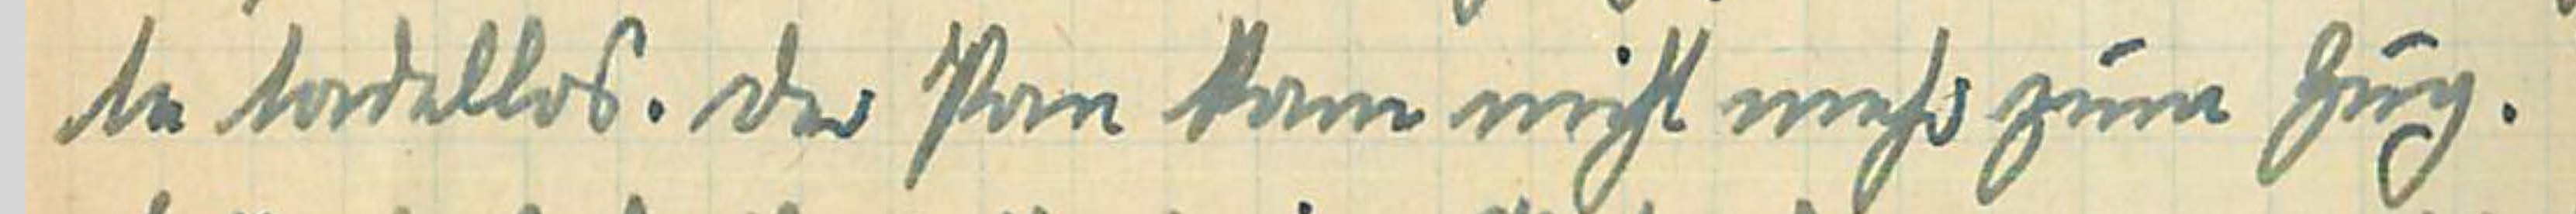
te tadellos. Der Pan kam nicht mehr zum Zug.
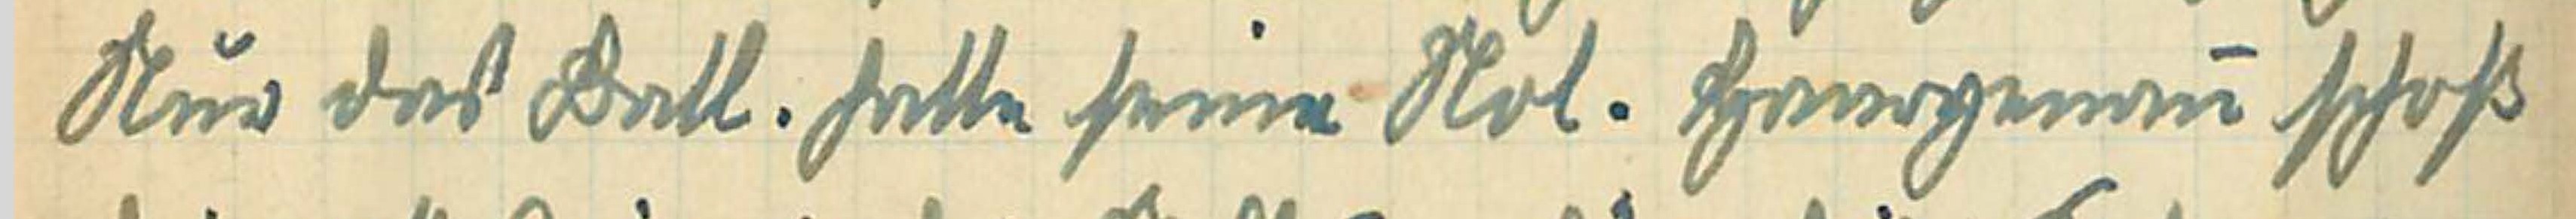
Nur das Batl. hatte seine Not. Haargenau schoß
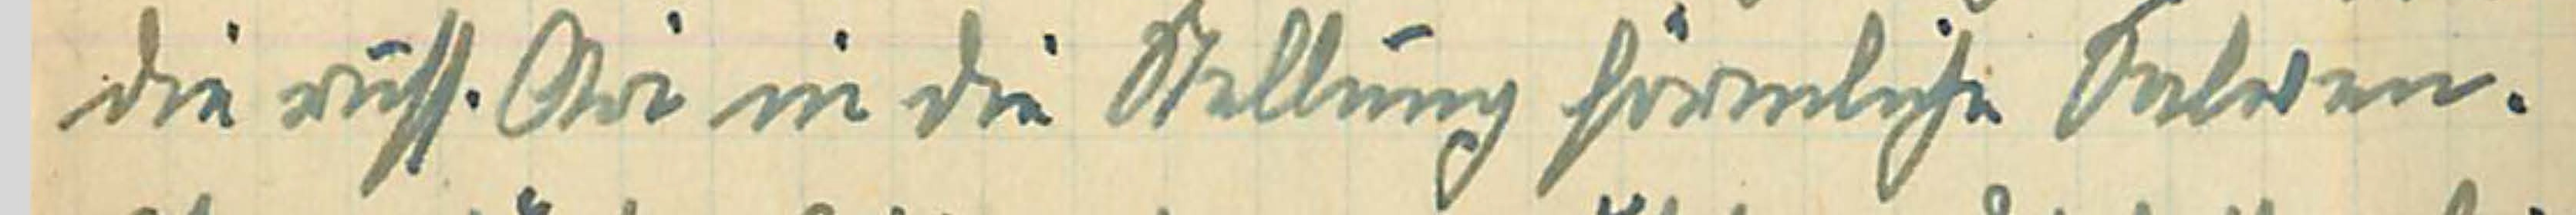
die russ. Ari in die Stellung förmliche Salven.
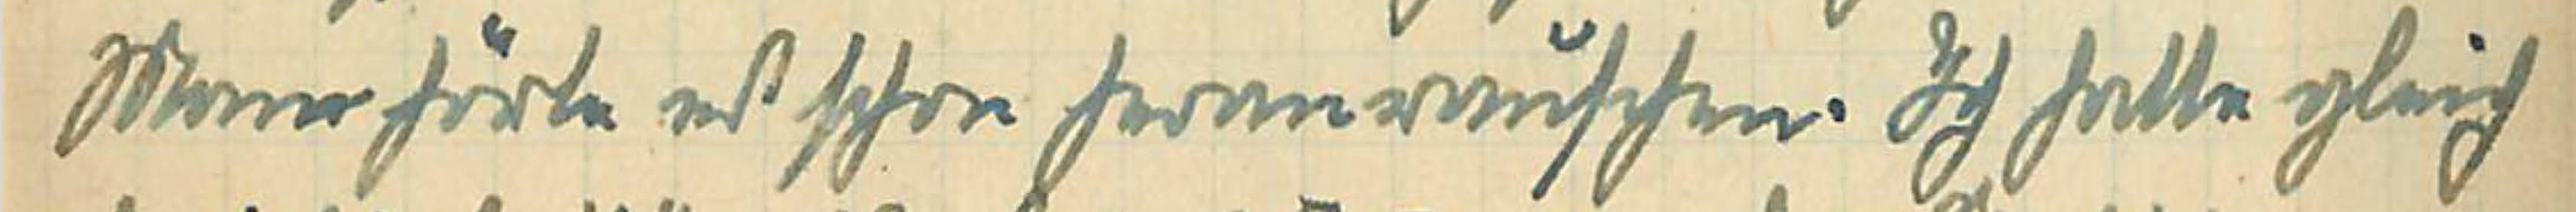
Man hörte es schon heranrauschen. Ich hatte gleich
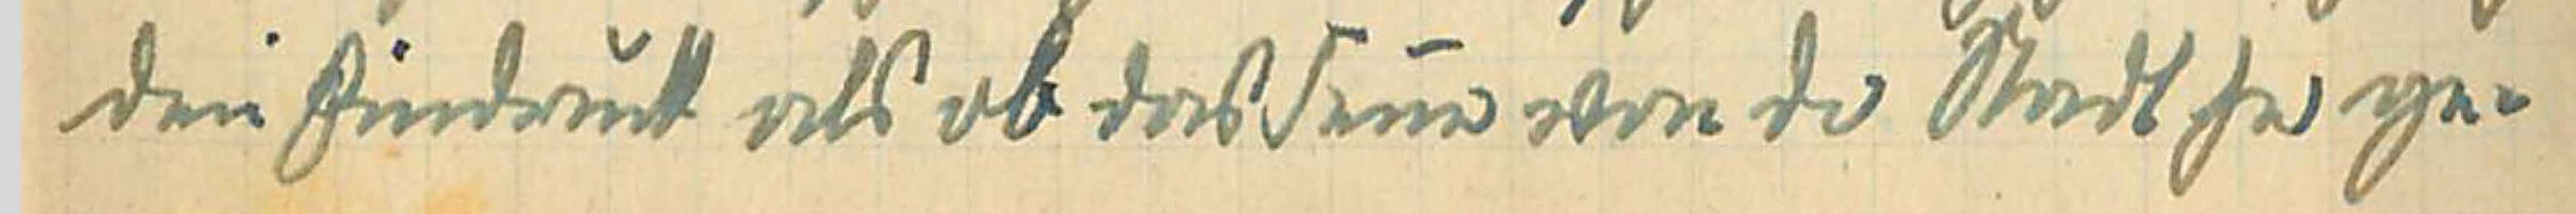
den Eindruck als ob das Feuer von der Stadt her ge-
